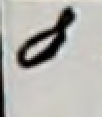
8
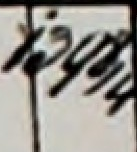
1398,4
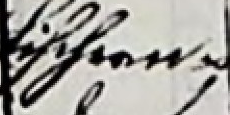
Fischern„
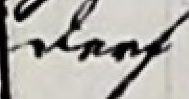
dorf
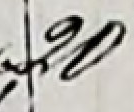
20
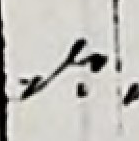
Do
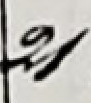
21
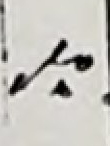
Do
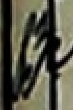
83
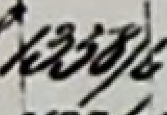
1358/b
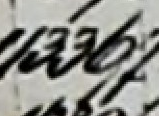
1336/f
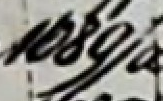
1089/a
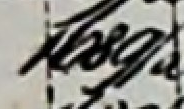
1089/a
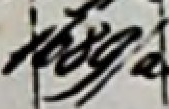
1089/a
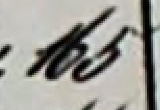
165
